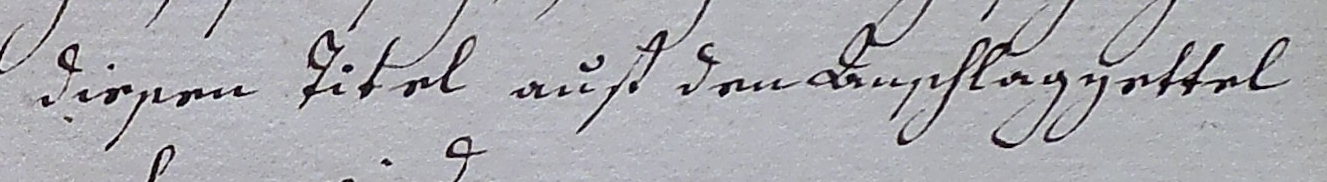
diesen Titel auf den Anschlagzettel
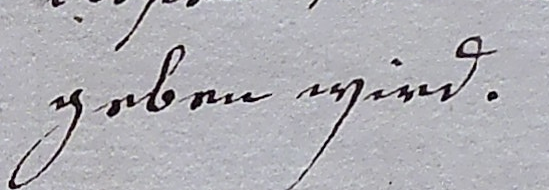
geben wird.
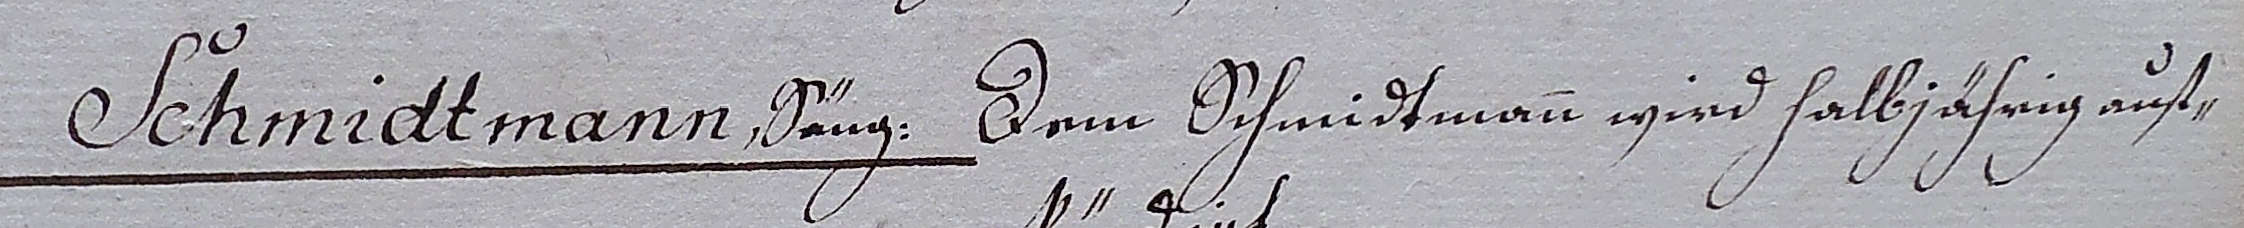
Schmidtmann, Tänz: Dem Schmidtman wird halbjährig auf¬
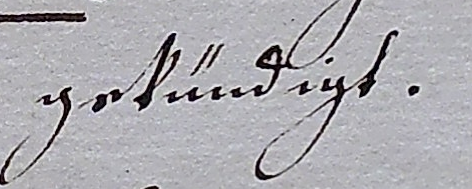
gekündigt.
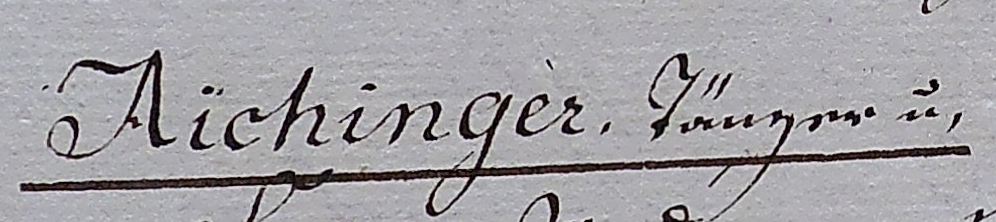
Aichinger, Tänzer u,
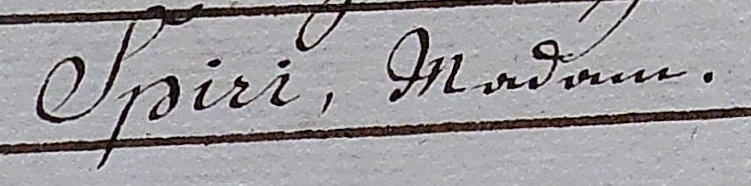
Spiri, Madam.
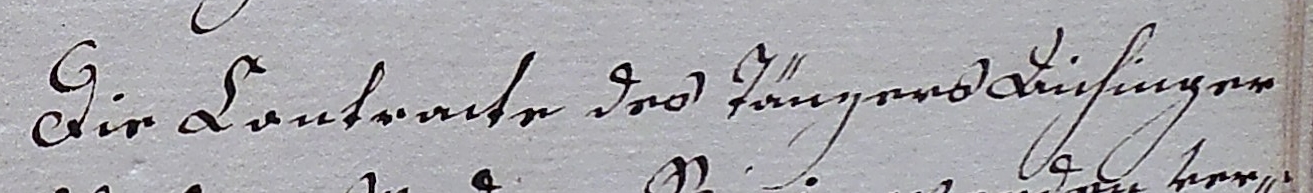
Die Contracte des Tänzers Aichinger
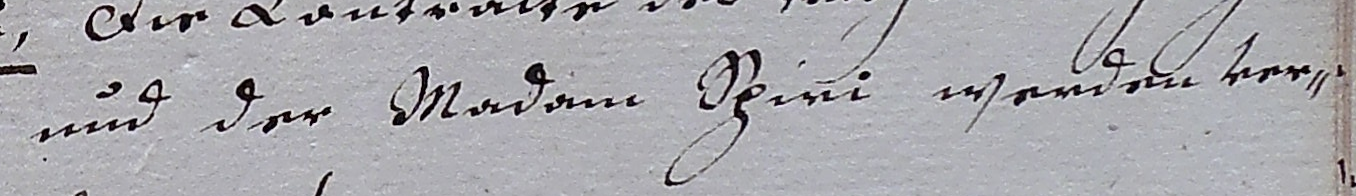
und der Madam Spiri werden ver¬
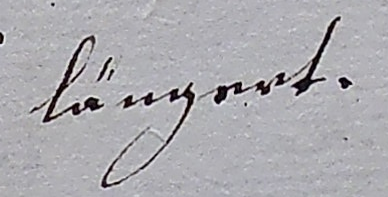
längert.
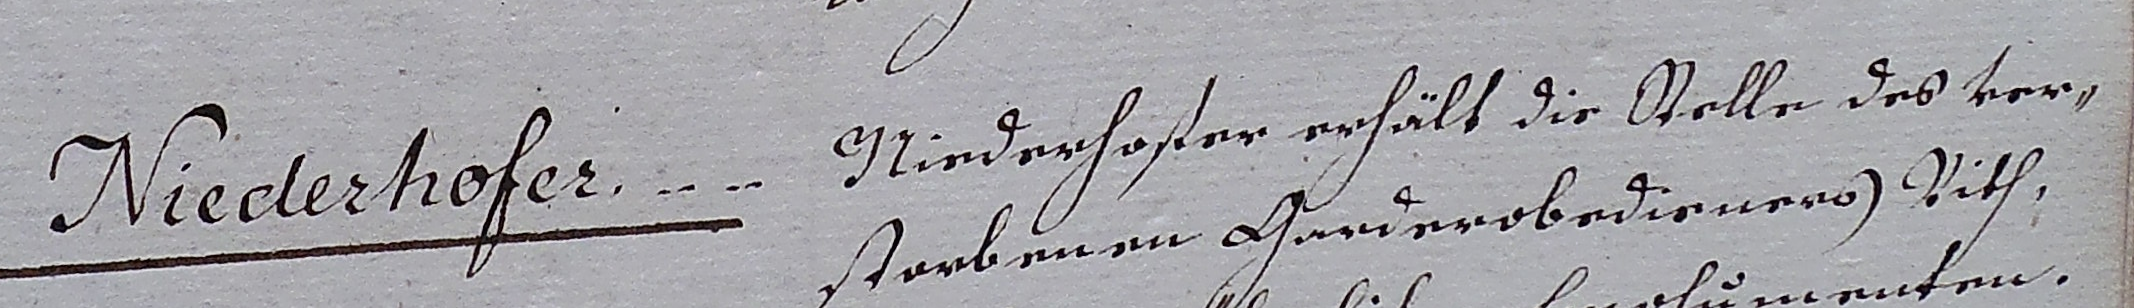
Niederhofer. .. .. Niederhofer erhält die Stelle des ver¬
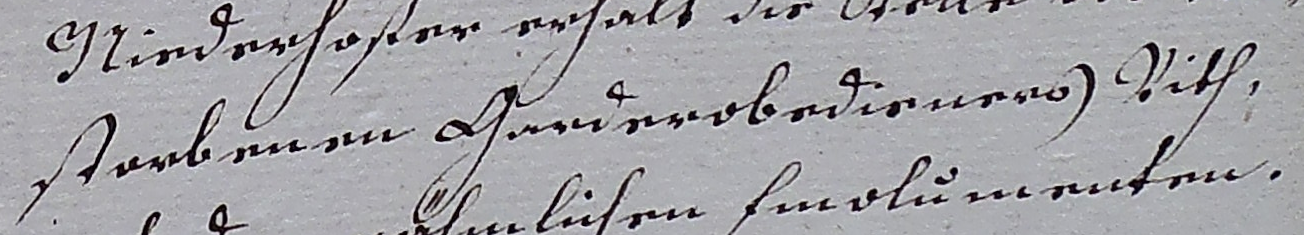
storbenen Garderobedieners Vith,
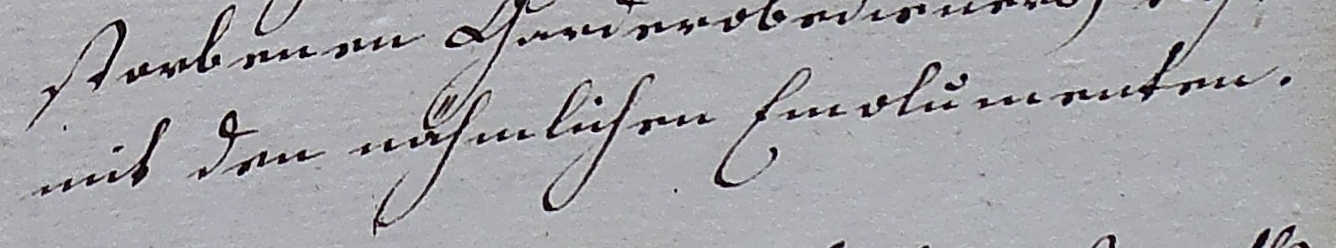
mit den nähmlichen Emolumenten.
